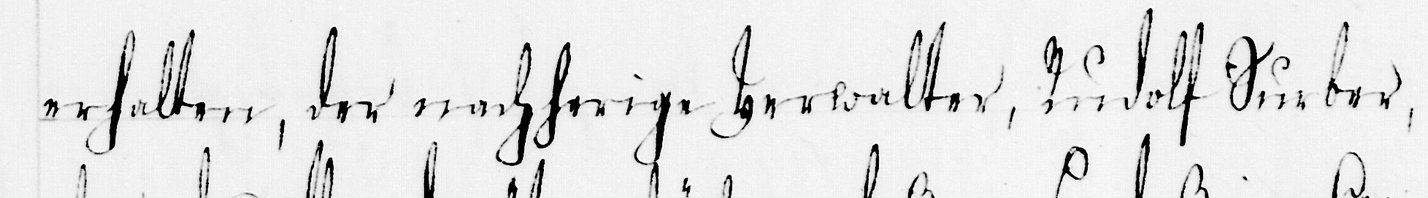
erhalten, der nachherige Verwalter, Rudolf Surber,
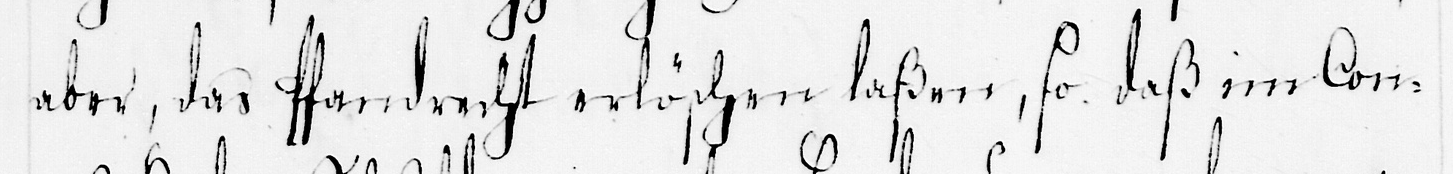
aber, das Pfandrecht erlöschen laßen, so daß im Con¬
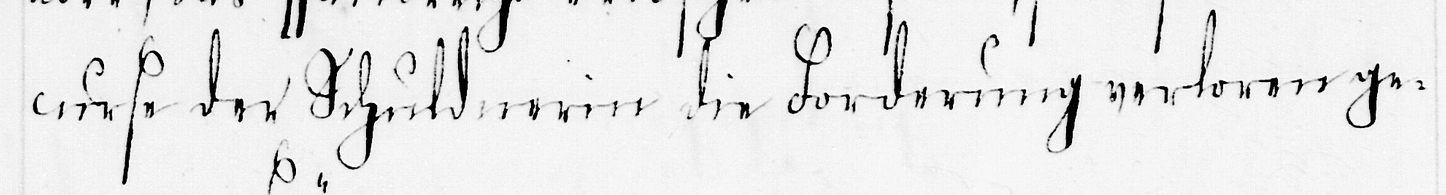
curse der Schuldnerin die Forderung verloren ge¬
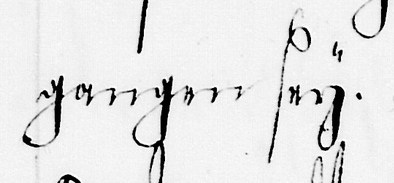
gangen sey.
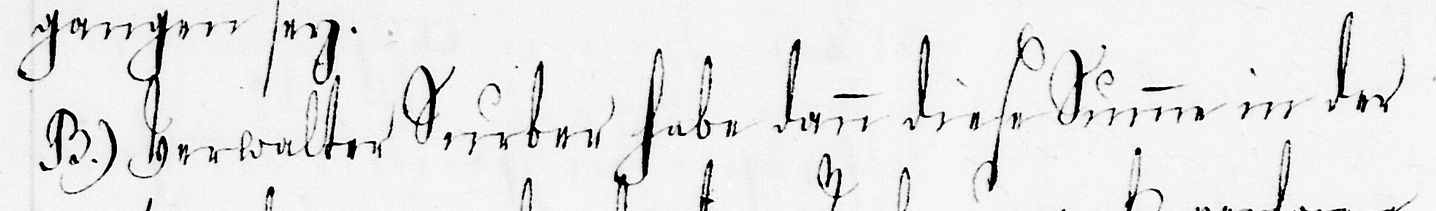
B.) Verwalter Surber habe dann diese Summe in der
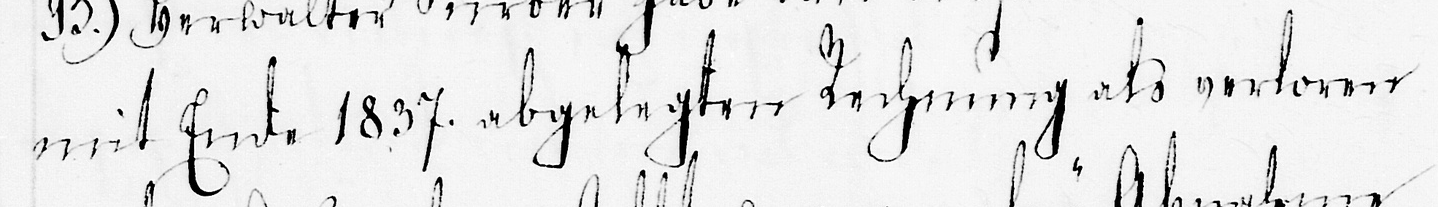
mit Ende 1837. abgelegten Rechnung als verloren
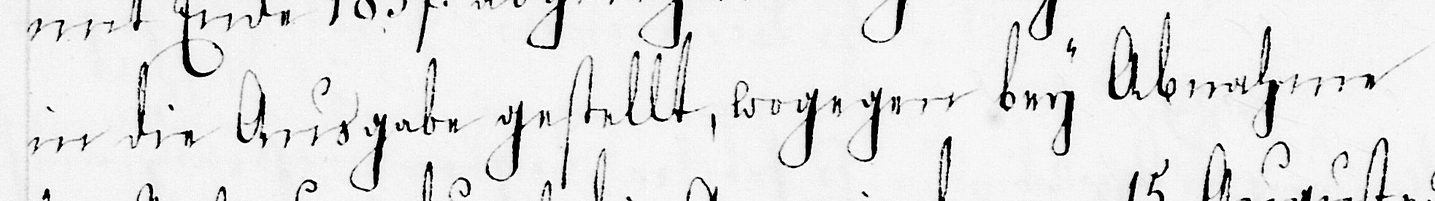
in die Ausgabe gestellt, wogegen bey Abnahme
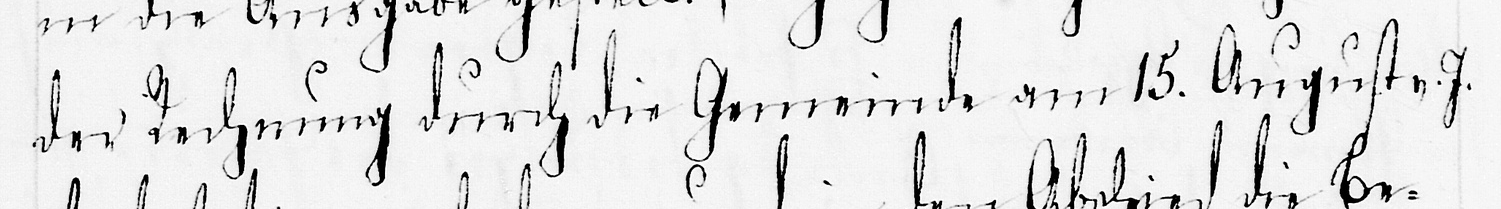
der Rechnung durch die Gemeinde am 15. August v.
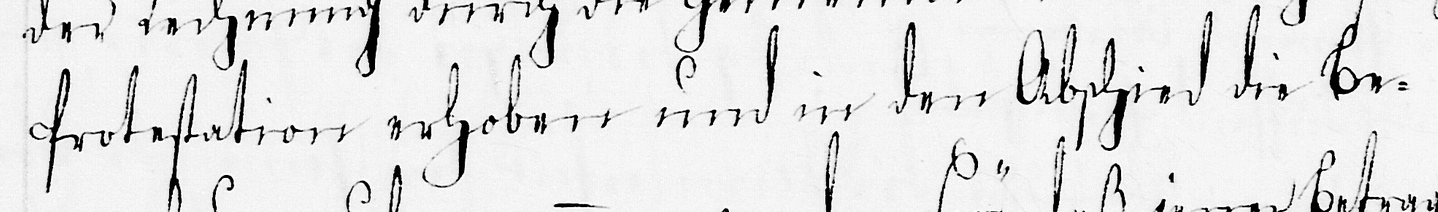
Protestation erhoben und in den Abschied die Be¬
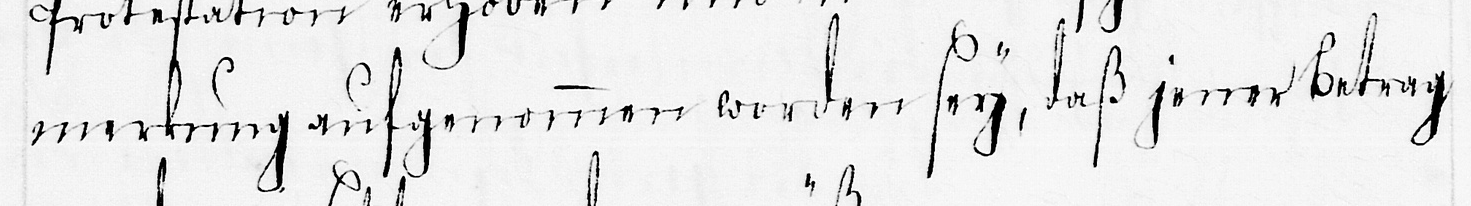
merkung aufgenommen worden sey, daß jener Betrag
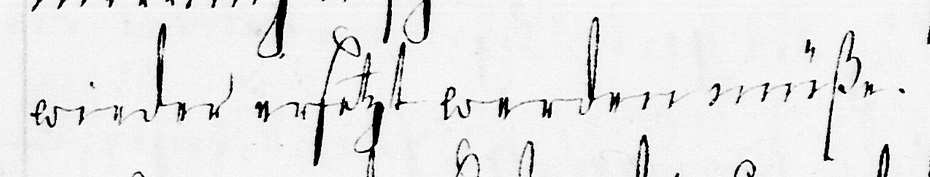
wieder ersetzt werden müße.
